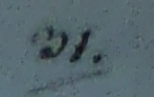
31.
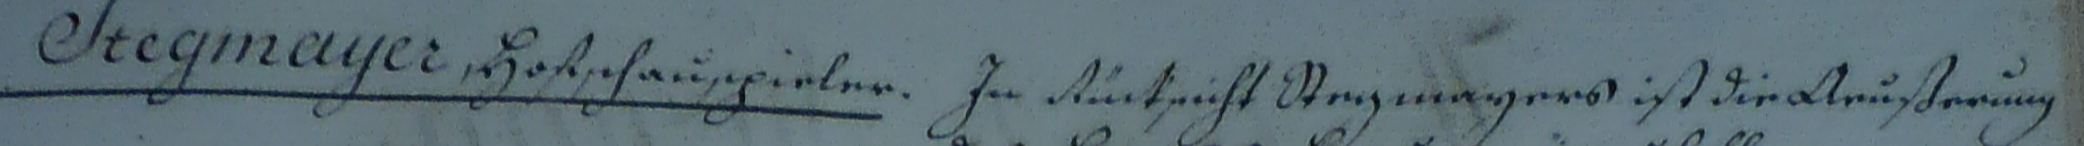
Stegmayer, Hofschauspieler. In Rücksicht Stegmayers ist die Aeußerung
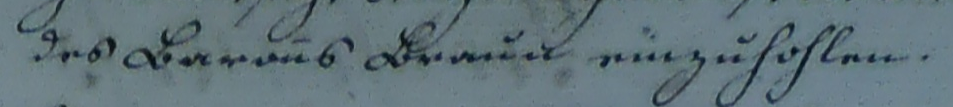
des Barons Braun einzuhohlen.
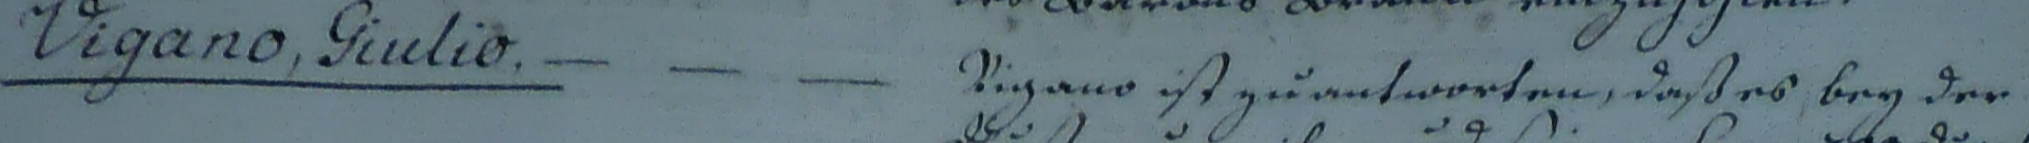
Vigano, Giulio, _ _ _ Vigano ist zu antworten, daß es bey der
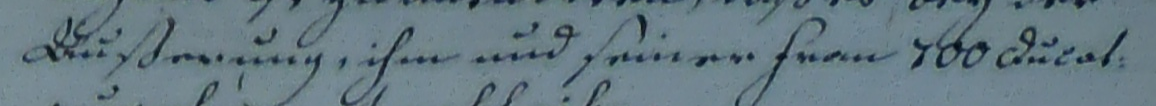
Außerung, ihm und seiner Frau 700 Ducat:
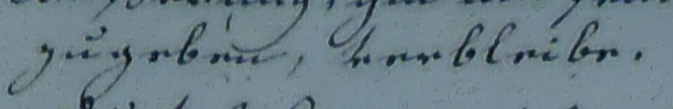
zugeben, verbleibe.
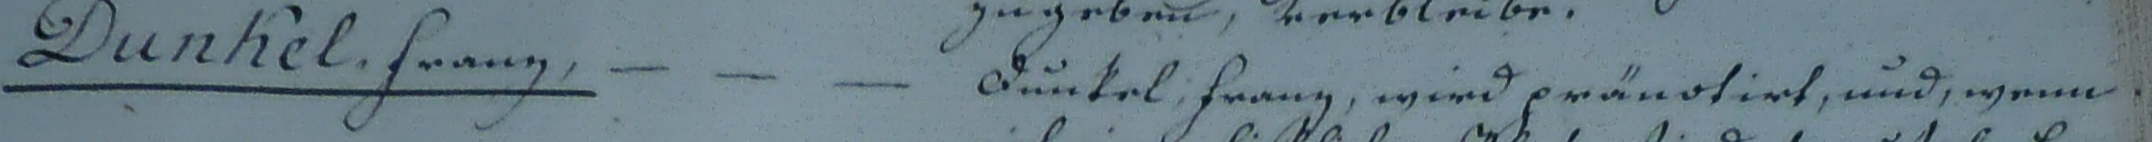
Dunkel, Franz, _ _ _ Dunkel, Franz, wird pränotirt, und, wenn
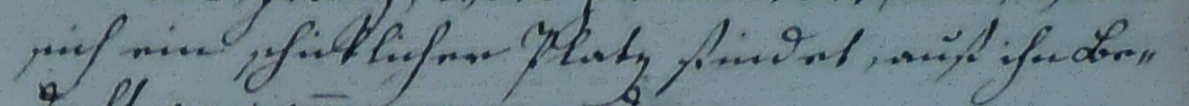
sich ein schicklicher Platz findet, auf ihn Be¬
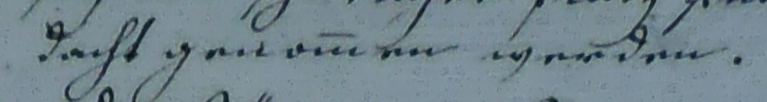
dacht genom̅en werden.
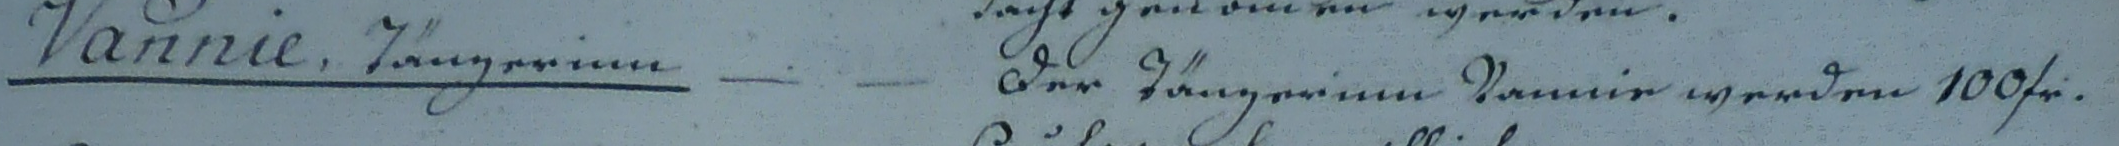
Vannie, Tänzerinn _ _ Der Tänzerinn Vannie werden 100fr.
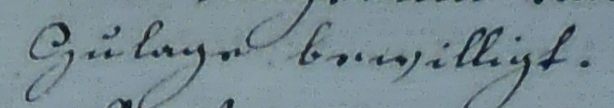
Zulage bewilligt.
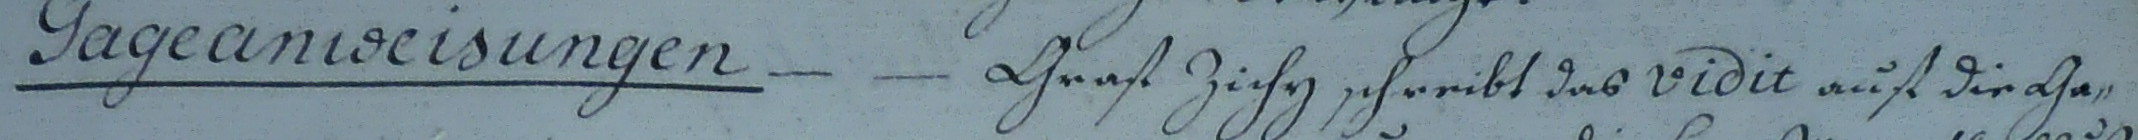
Gageanweisungen _ _ Graf Zichy schreibt das vidit auf die Ga¬
